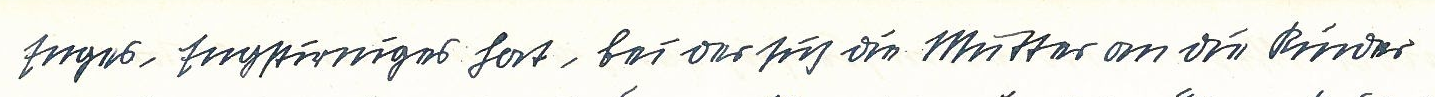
Enges, Engstirniges hat, bei der sich die Mutter an die Kinder
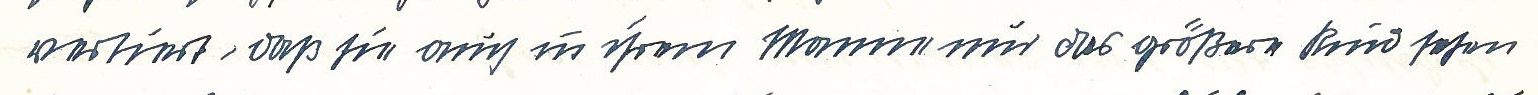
verliert, daß sie auch in ihrem Manne nur das größere Kind sehen
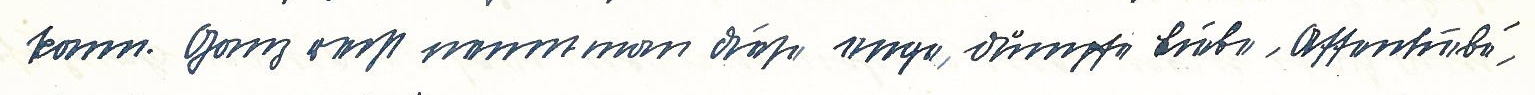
kann. Ganz recht nennt man diese enge dumpfe Liebe „Affenliebe“,
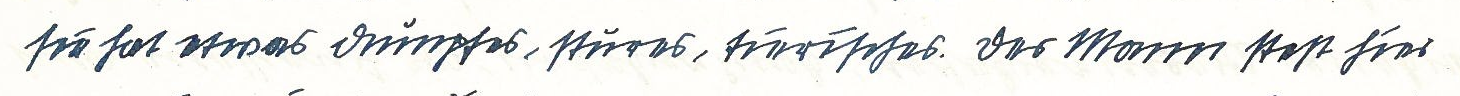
sie hat etwas dumpfes, stures, tierisches. Der Mann steht hier
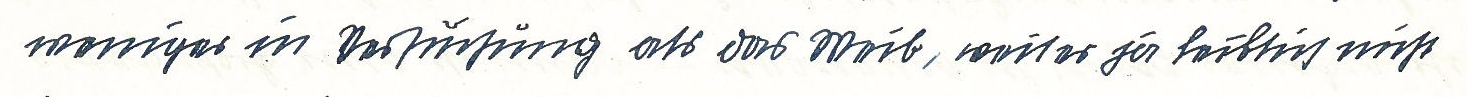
weniger in Versuchung als das Weib, weil er ja leiblich nicht
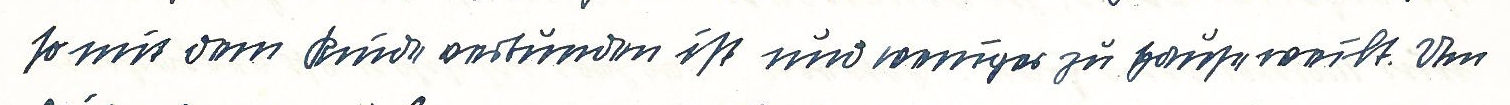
so mit dem Kind verbunden ist und weniger zu Hause weilt. Um
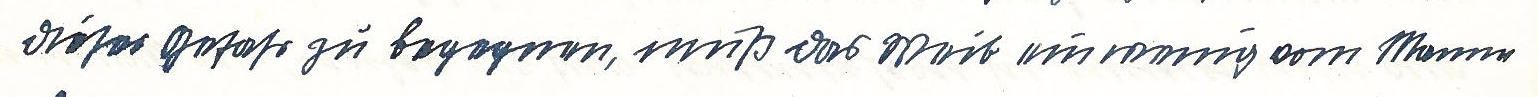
dieser Gefahr zu begegnen, muß das Weib ein wenig vom Manne
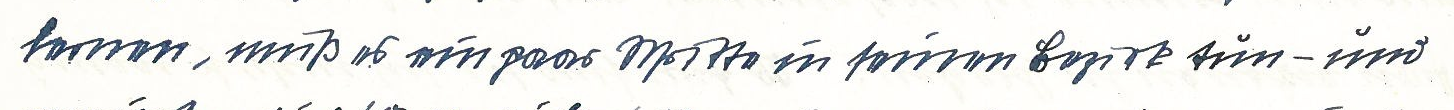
lernen, muß es ein paar Schritte in seinen Bezirk tun – und
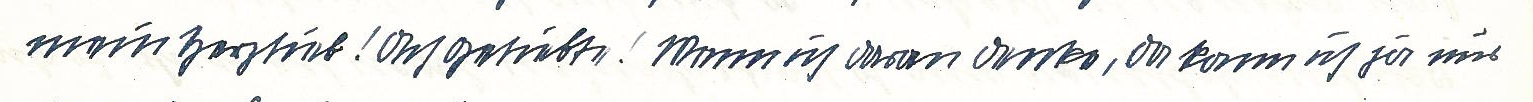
mein Herzlieb! Ach Geliebte! Wenn ich daran denke, da kann ich ja nur
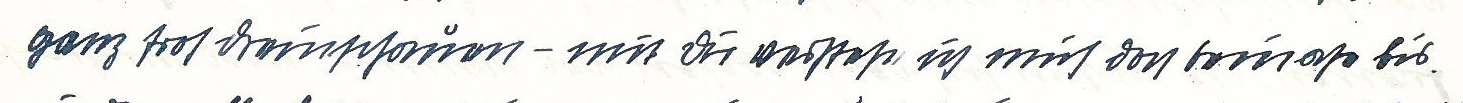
ganz froh dreinschauen – mit Dir verstehe ich mich doch beinahe bis
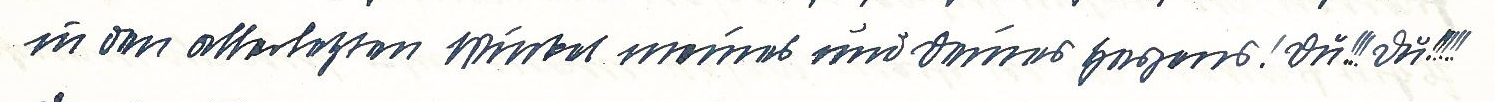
in den allerletzten Winkel meines und Deines Herzens! Du!!! Du!!!!!
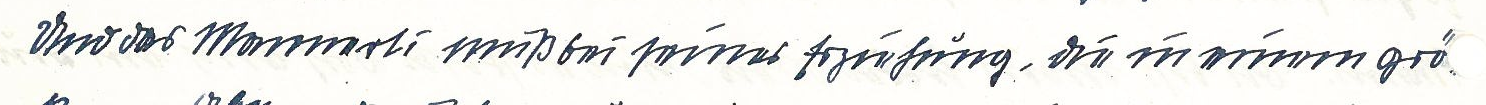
Und das Mannerli muß bei seiner Erziehung, die in einem grö¬
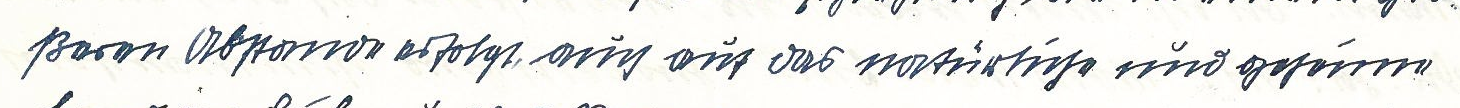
ßeren Abstande erfolgt, auch auf das natürliche und geheime
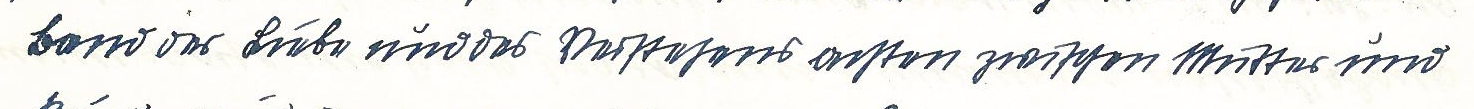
Band der Liebe und des Verstehens achten zwischen Mutter und
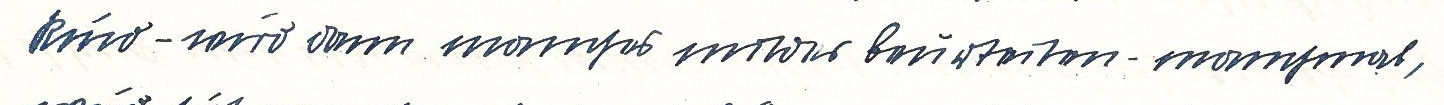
Kind – wird dann manches milder beurteilen – manchmal,
